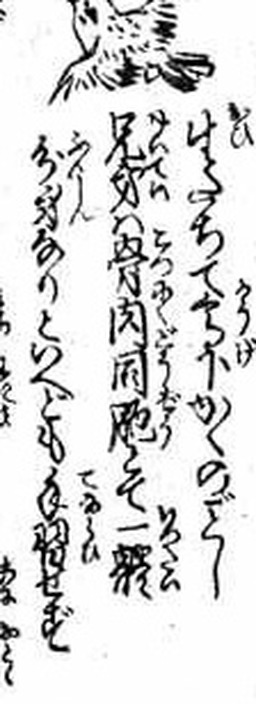兄弟は骨肉同胞とて一体
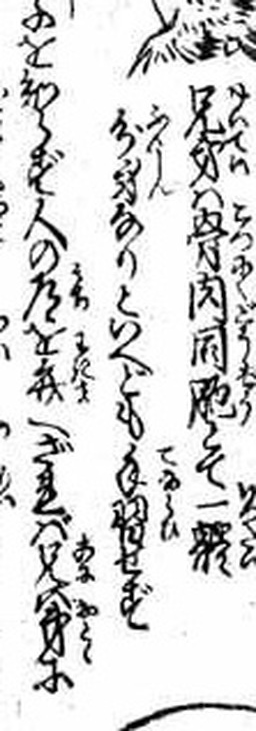分身なりといへども手習せず
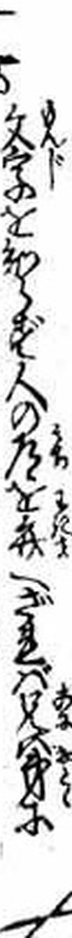文字を知らず人の道を弁へざれば兄は弟に
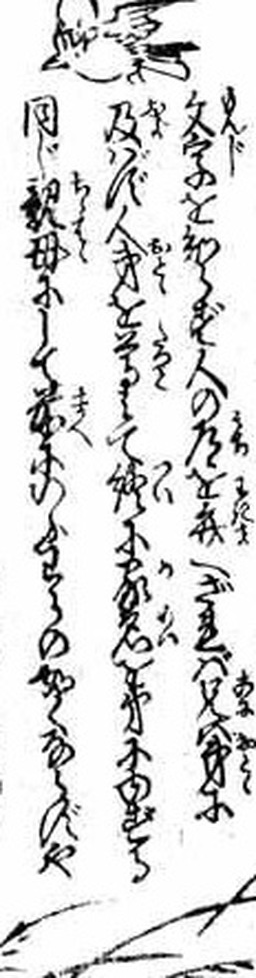及ばず人弟を尊みて終に家名を弟にゆずる
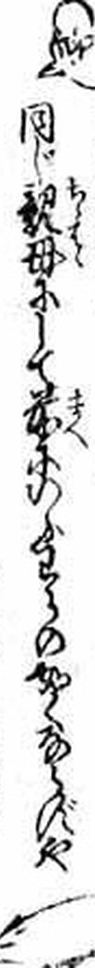同じ親母にして前にいふわらの如くならずや
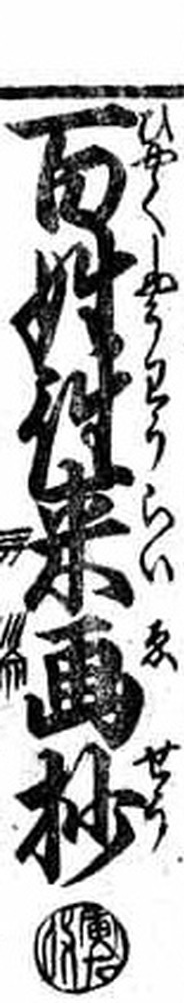百姓往来画抄
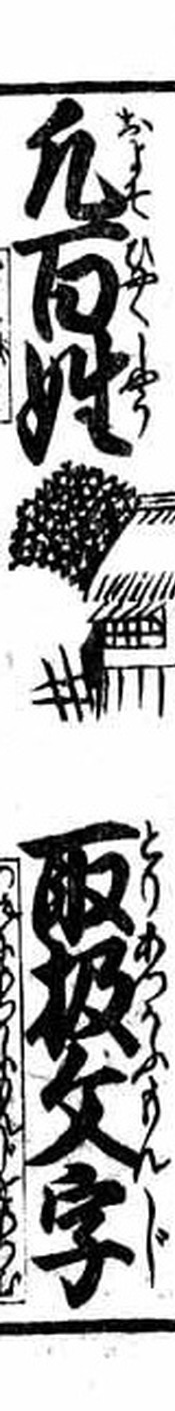凡百姓取扱文字
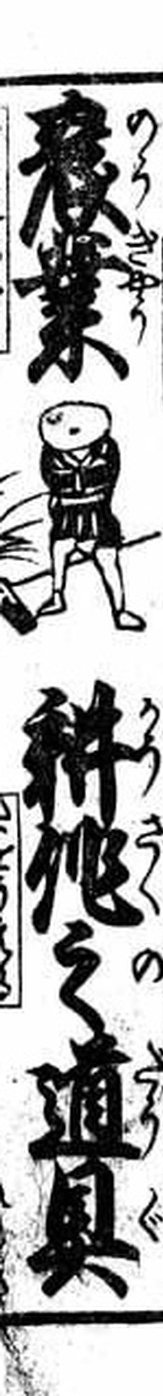農業耕作之道具
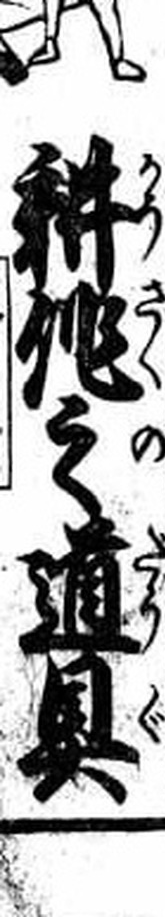農業耕作之道具

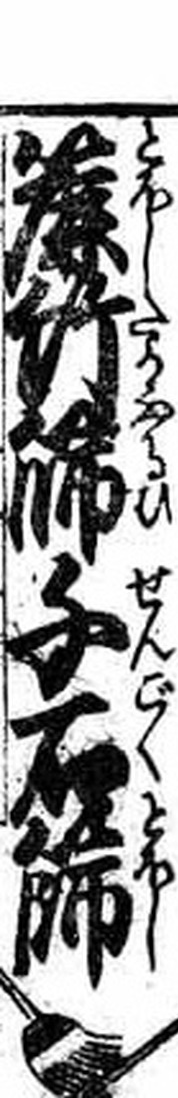簾竹篩千石篩箒
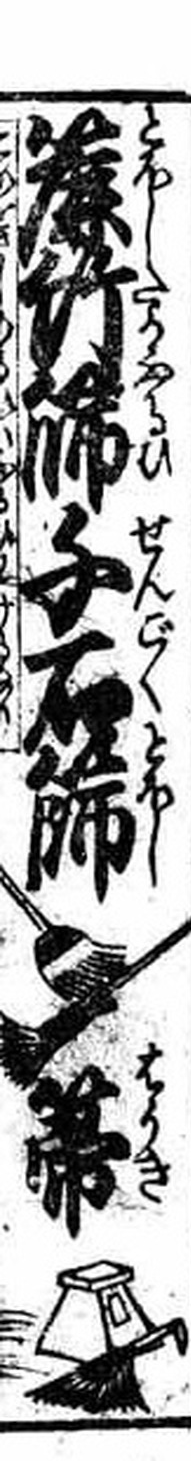簾竹篩千石篩箒
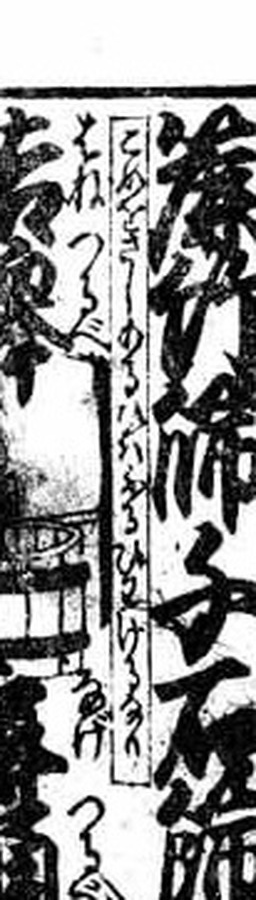こめをさしあるひははふるいわけるなり

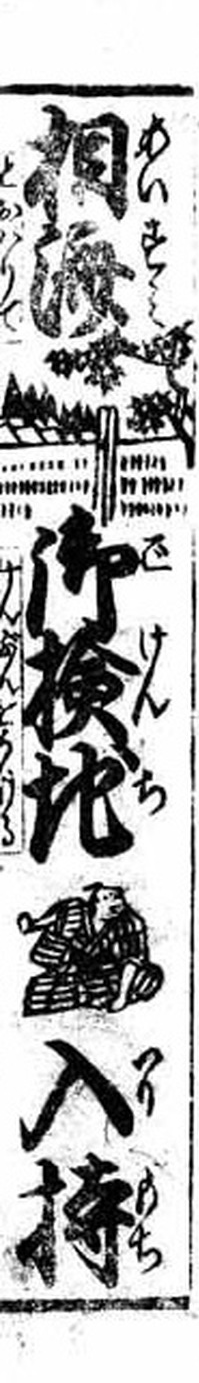相済御検地入持
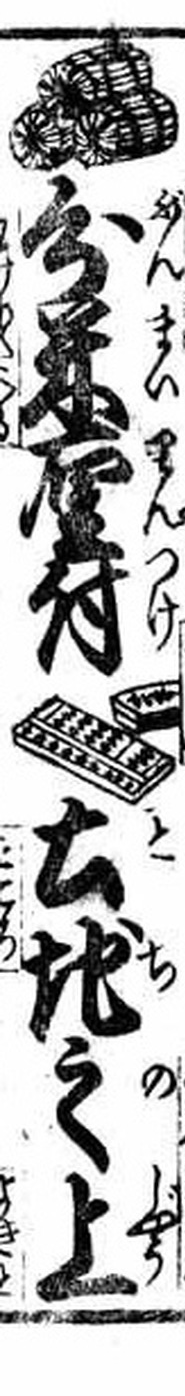分米厘付土地之上
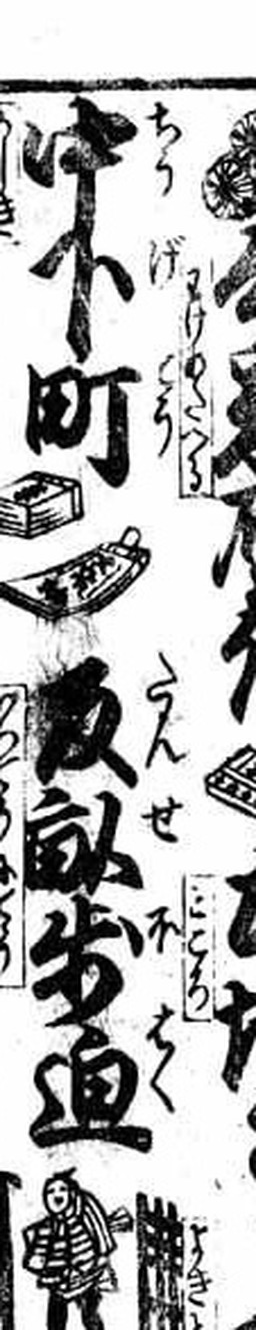中下町反畝歩迫
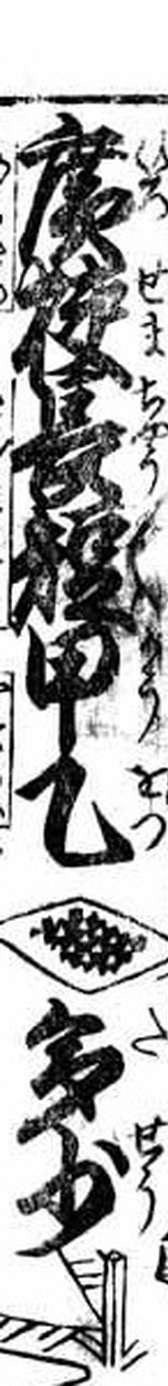広狭長短甲乙多少
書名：百姓往来画抄
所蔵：東京学芸大学教育コンテンツアーカイブ
